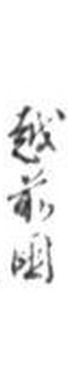越前国
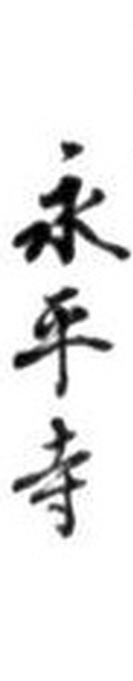永平寺
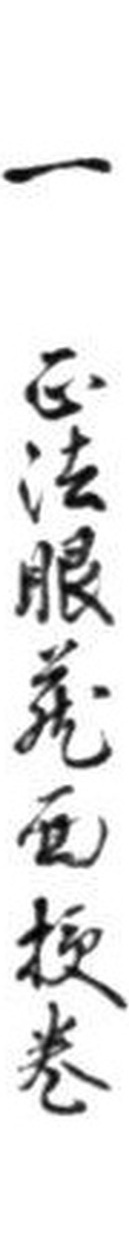一正法眼蔵面授巻
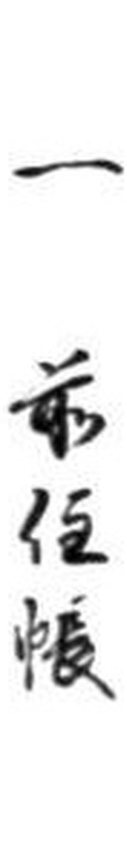一前住帳
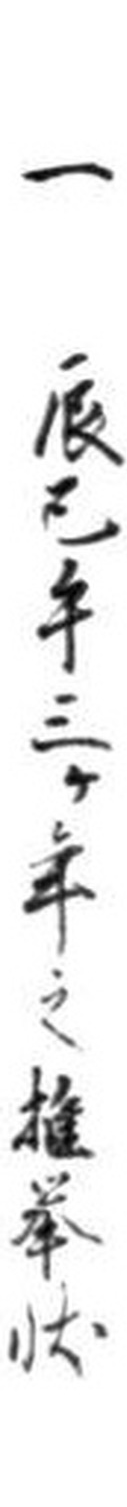一辰巳午三ケ年之推挙状
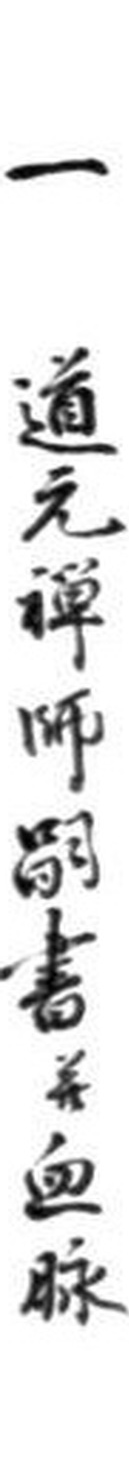一道元禅師嗣書并血脈
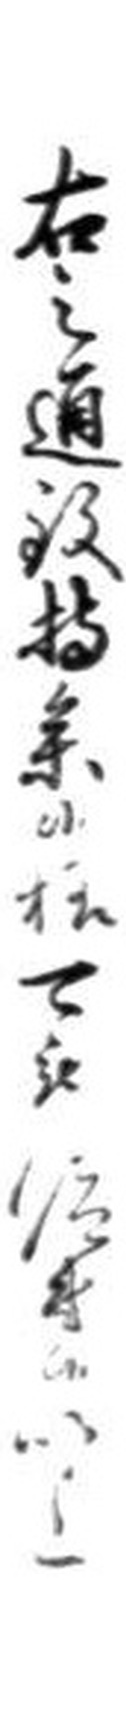右之通致持参候様可被仰付候以上
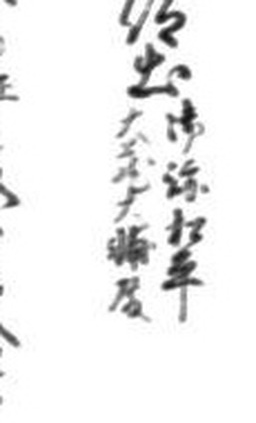大蔵大輔殿
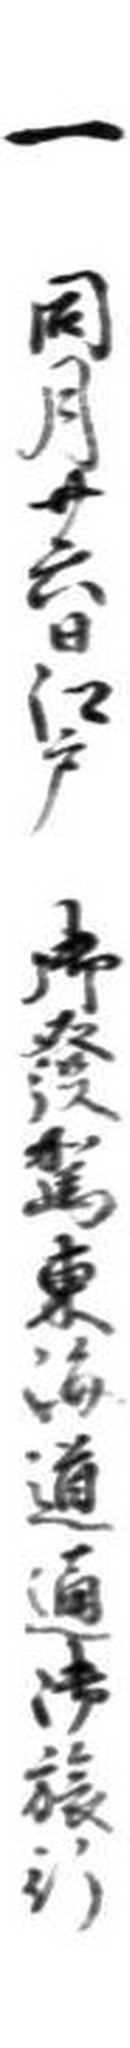一同月廿六日江戸御発駕東海道通御旅行

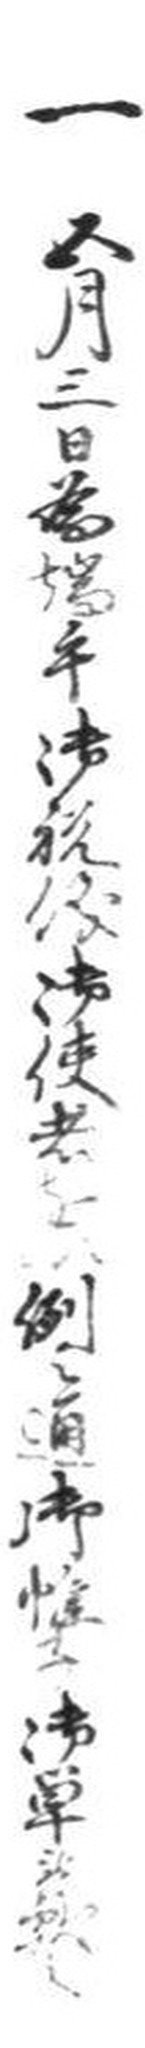一五月三日為端午御祝儀御使者を以例之通御帷子御単被献之
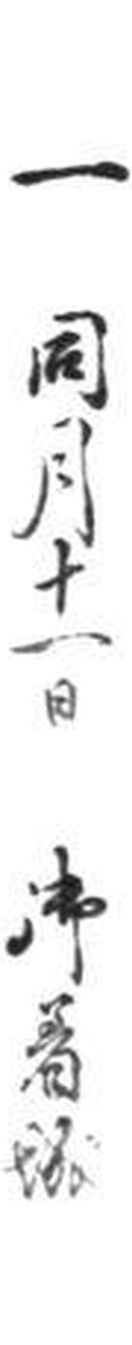一同月十一日御着城
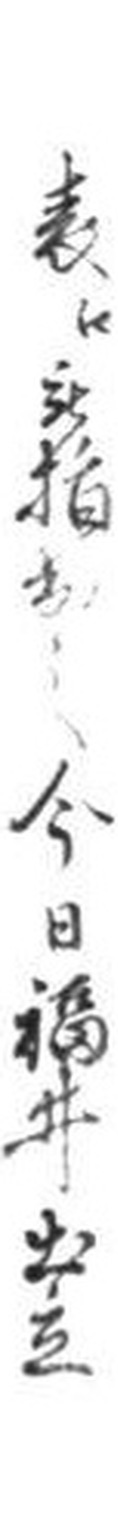表江被指出之今日福井出立
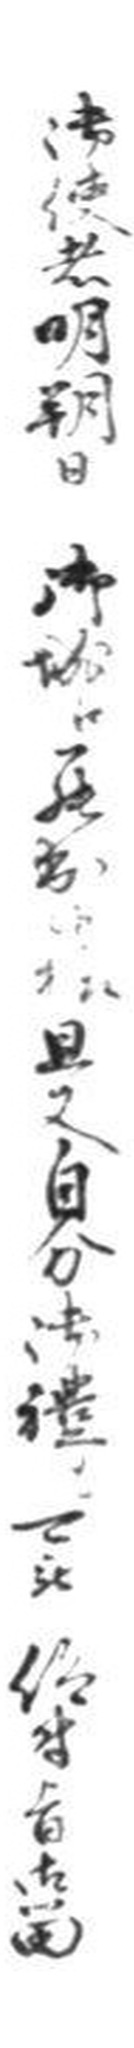御使者明朔日御城江罷出候様且又自分御礼も可被仰付旨御留
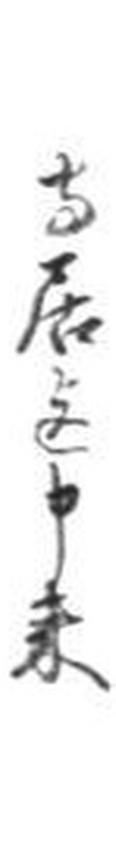守居迄申来
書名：家譜 二十二 吉品公 従元禄十五年到同十六年
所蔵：福井県文書館 Fukui Prefectural Archives
